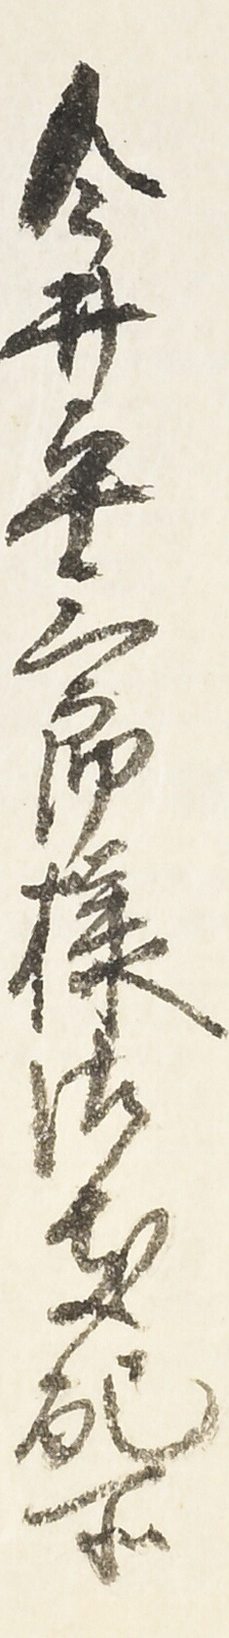今井平三郎様御支配所
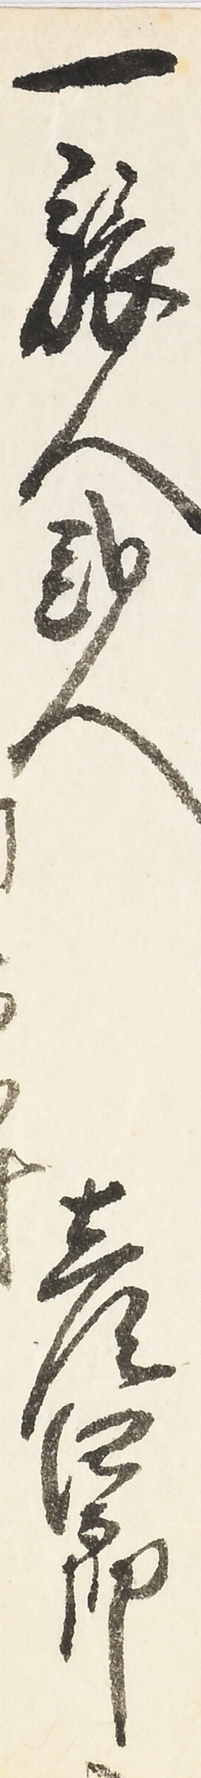一旅人弐人彦四郎・
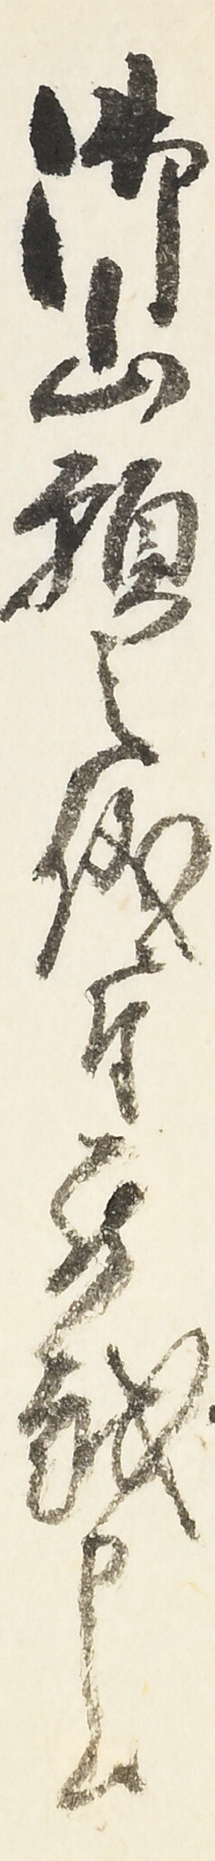御山預之義ニ付罷越申候
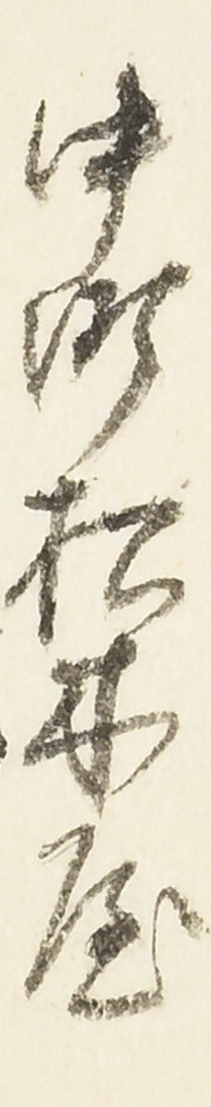中町松木屋
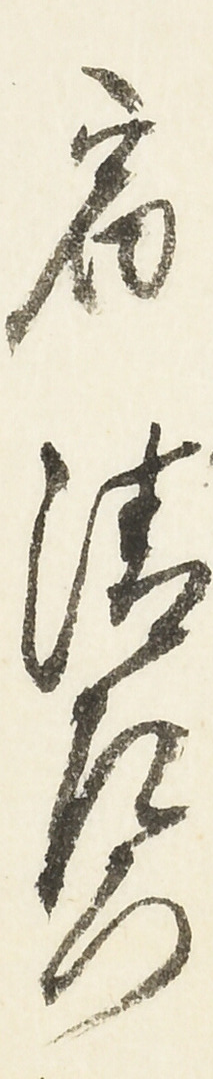宿清左衛門
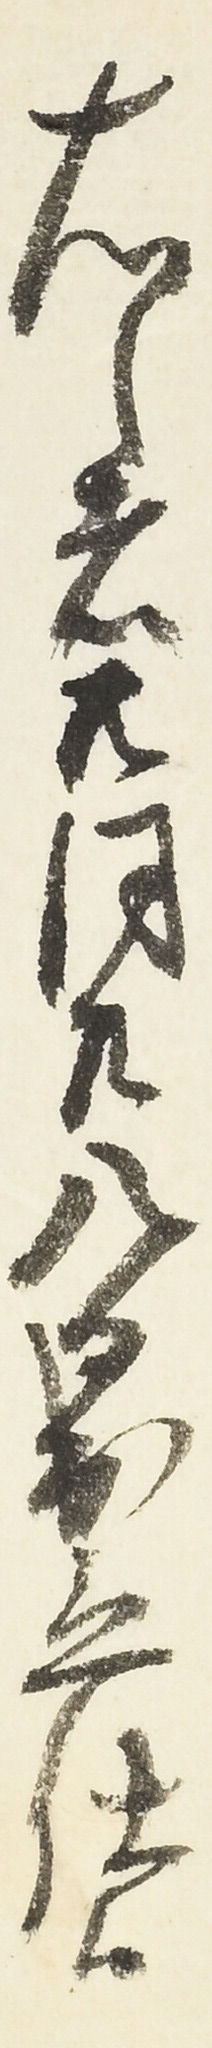右之者共同廿八日出立仕候
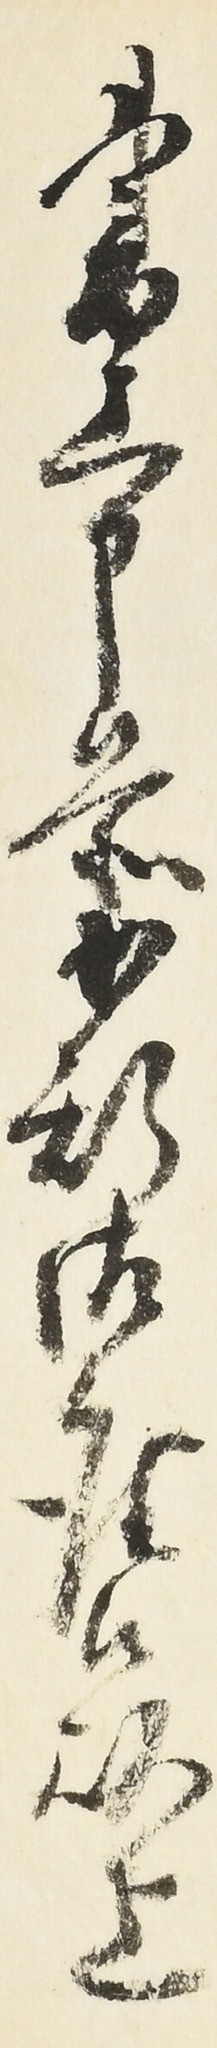書上申候所如斯御座候以上
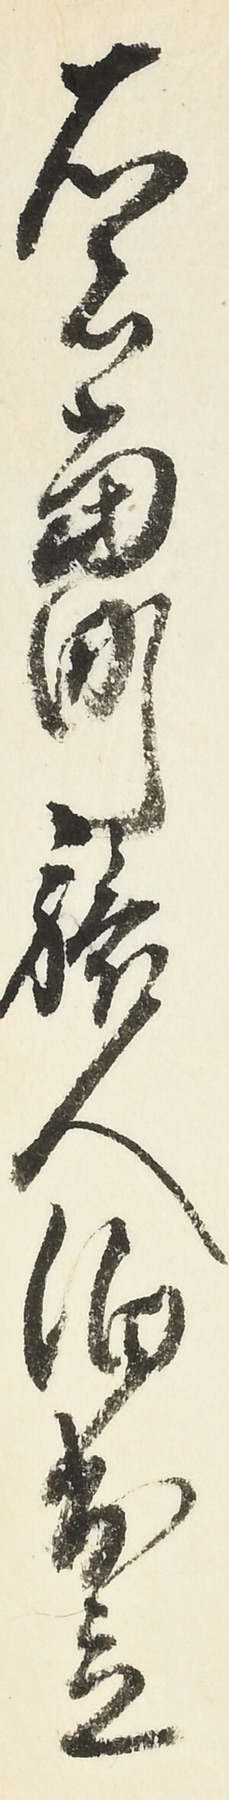右者当町旅人泊出立
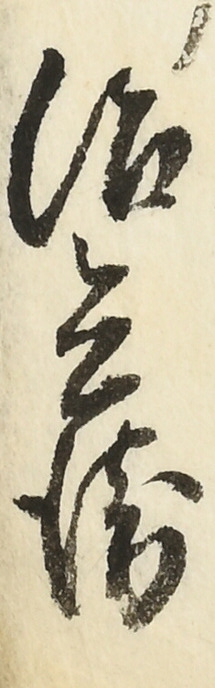治兵衛

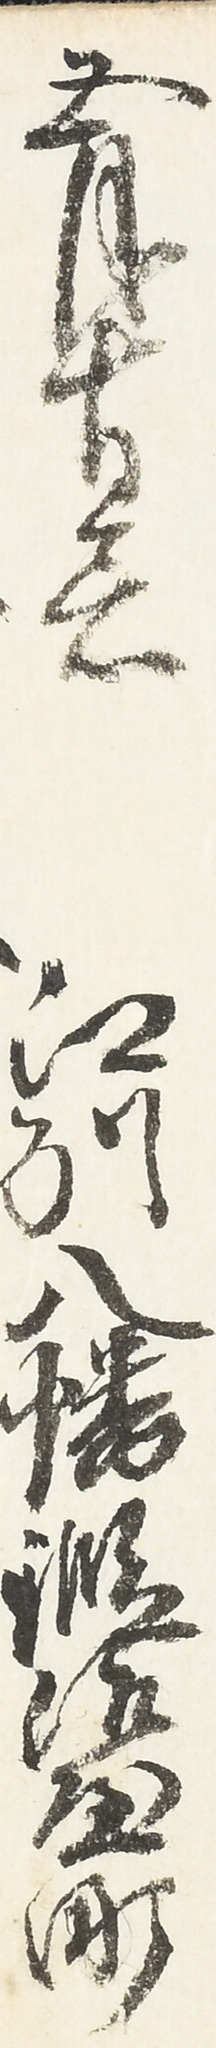五月十日着江州八幡鍛冶屋町
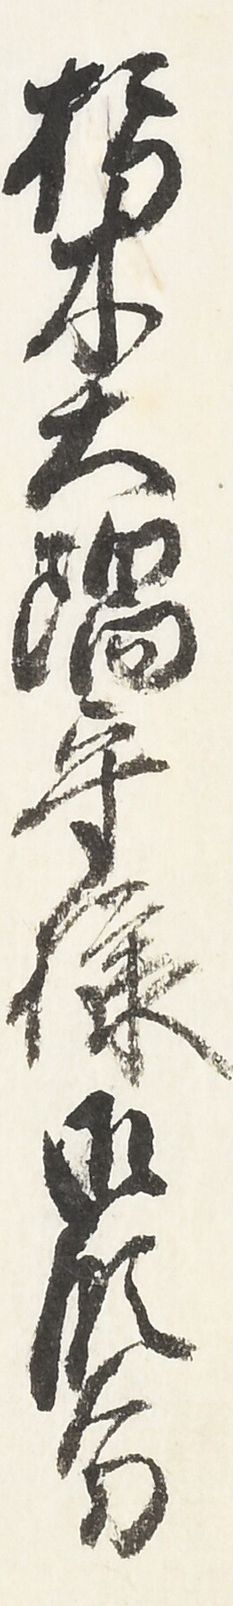朽木大隅守様御領分
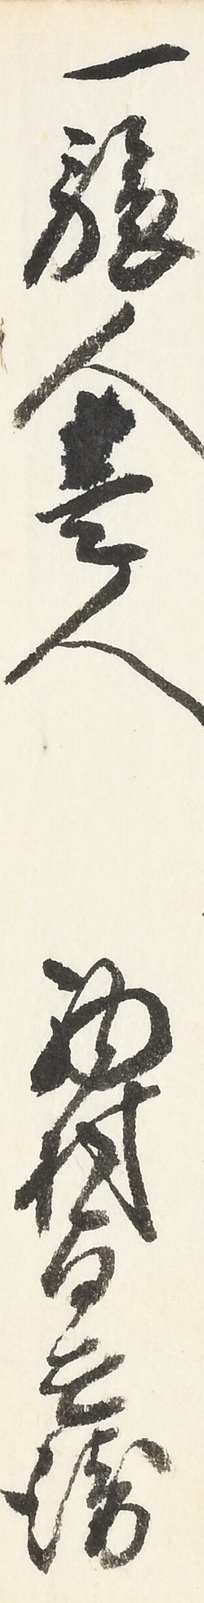一旅人壱人西村与兵衛
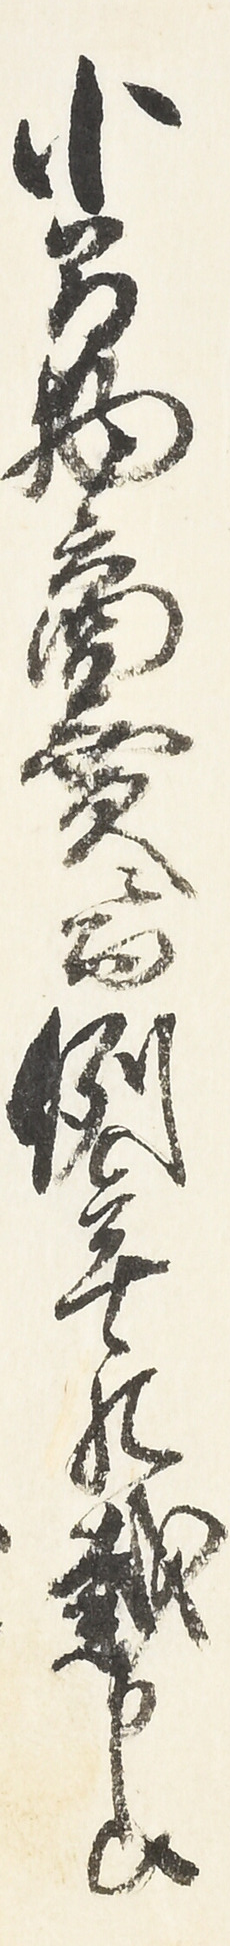小間物商売ニ而例年罷越申候
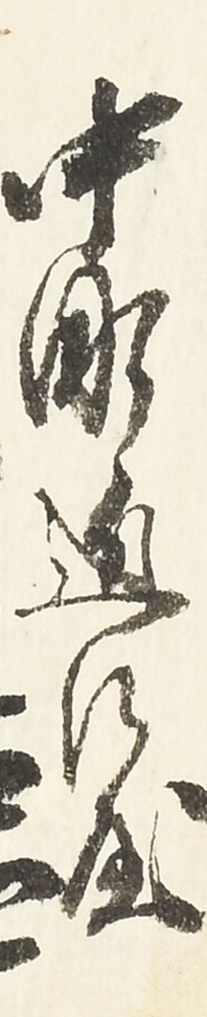中町近江屋
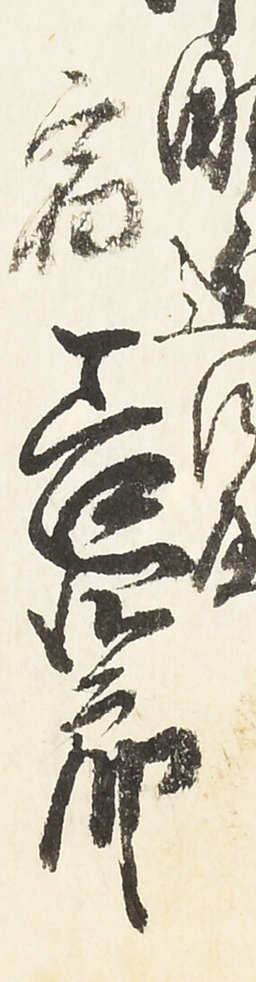宿善四郎
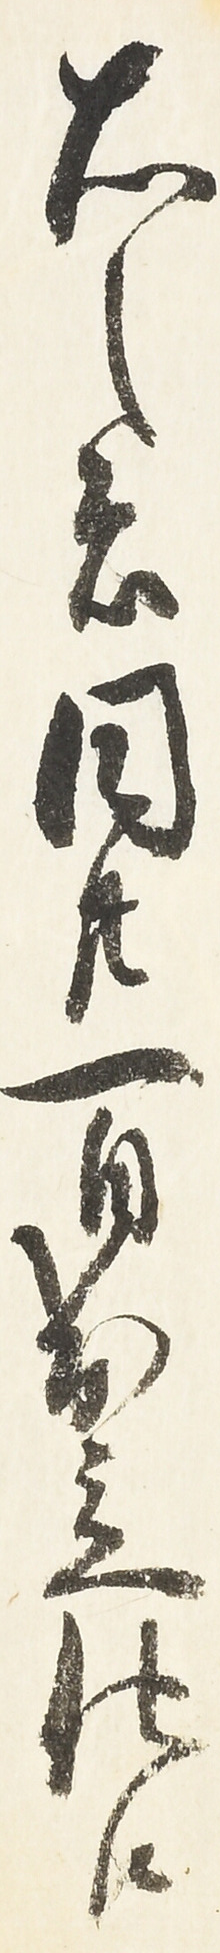右之者同廿一日出立仕候
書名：町中旅人泊控帳
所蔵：伊那市立高遠町図書館・合同会社AMANE
